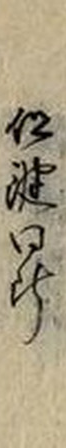但鍵同断
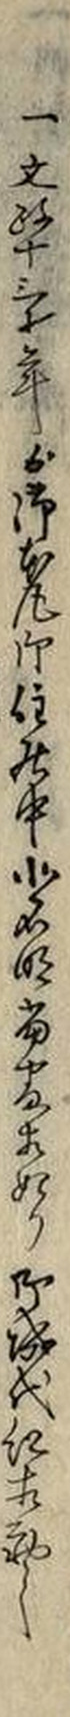一文政十三寅年ゟ御本丸御住居中北不明当番相始り御城代組相勤之
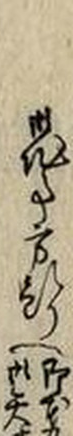東御作事方預り
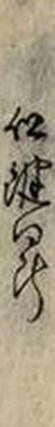但鍵同断
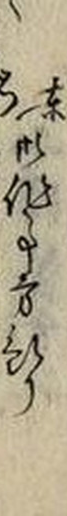東御作事方預り
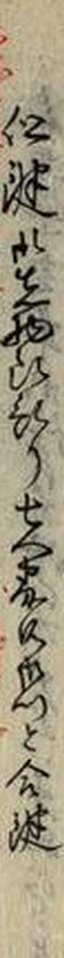但鍵御先物頭預り七人番所御門と合鍵
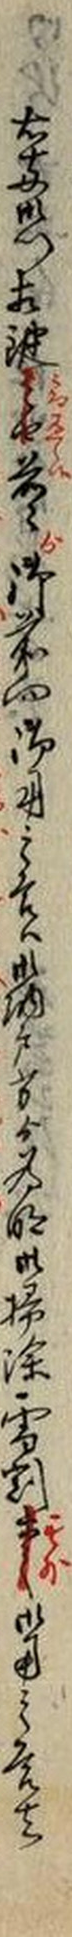右両御門相鍵に而有之候由前々ゟ御前向御用之節は御納戸方ゟ為明御掃除雪割其外御用之節者
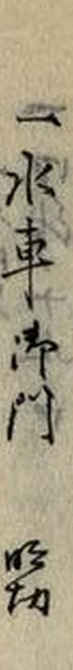一水車御門明切
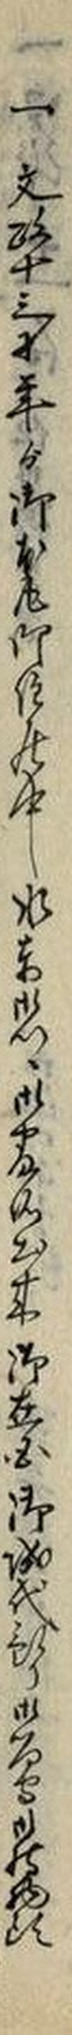一文政十三寅年ゟ御本丸御住居中水車御門へ御番所出来御在国御城代預り御留守御持物頭
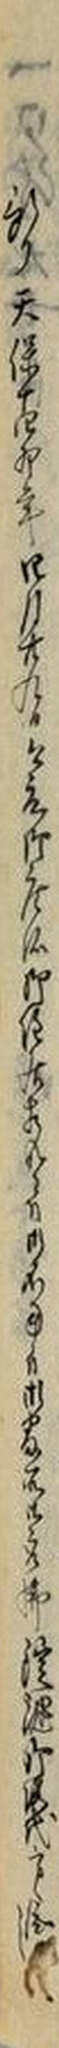預り天保十四卯年四月廿九日今度御座所御住居相成候二付御不用御番所御取払錠鍵御城代方へ渡之
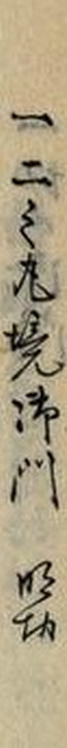一二之丸境御門明切
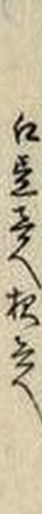但昼壱人夜壱人
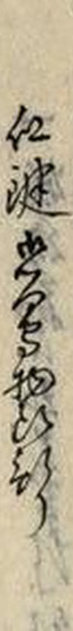但鍵御留守物頭預り
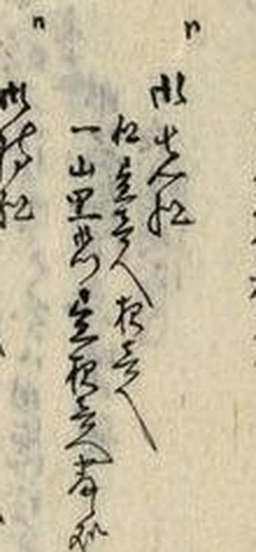但昼壱人夜壱人
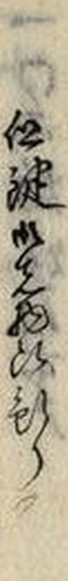但鍵御先組頭預り
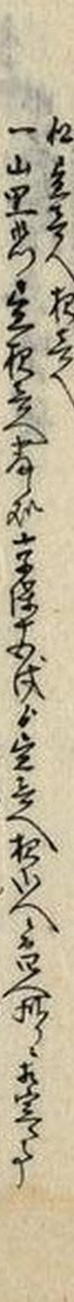一山里御門昼夜壱人番候処享保十五戌ゟ昼壱人夜弐人に而四人掛りに相定候事
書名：御門御櫓之部
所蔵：福井県文書館 Fukui Prefectural Archives
